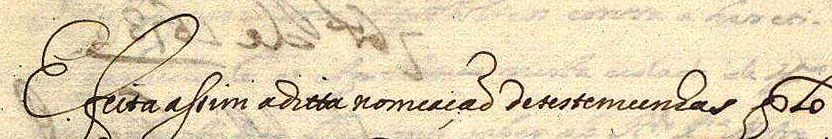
E feita assim a ditta nomeaçaõ de testemunhas plo
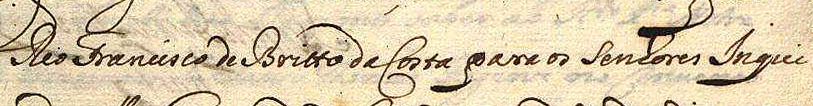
Reo Francisco de Britto da Costa para os Senhores Inqui
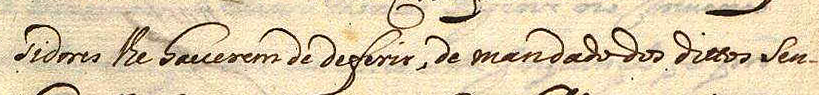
sidores lhe hauerem de deferir, de mandado dos dittos sen
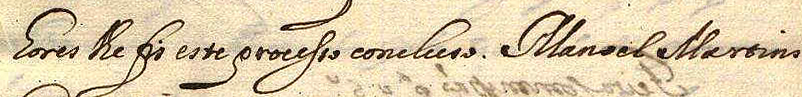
hores lhe fis este processo concluso. Manoel Martins
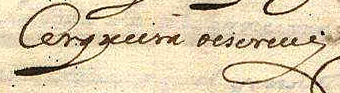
Cerqueira o escreuy
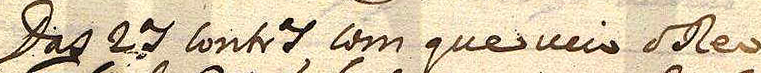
Das 2as contras, com que ueio o Reo
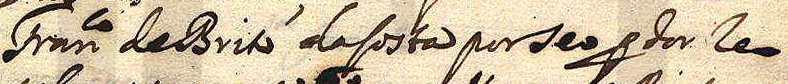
Franco de Brito da Costa por seo ꝓdor Re
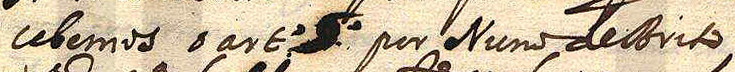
cebemos o art.o 5.o por Nuno de Brito,
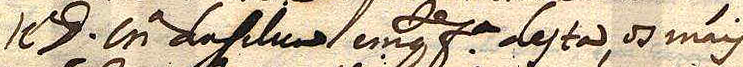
E D. Cna da Silua emqto f.a desta, os mais
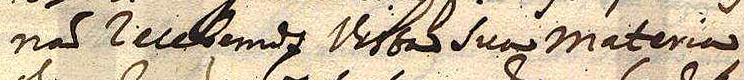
naõ Recebemos Vista sua materia
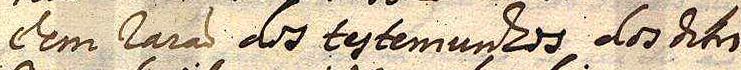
E em Razaõ dos testemunhos dos ditos
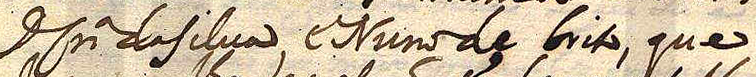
D Cna da Silua, E Nuno de brito, que
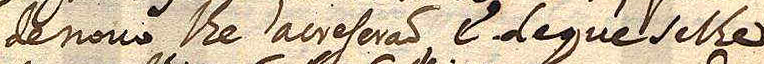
de nouo lhe acreseraõ, E de que se lhe
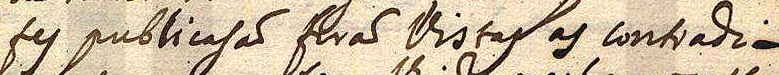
fes publicasaõ foraõ Vistas as contradi
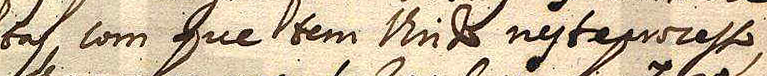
tas, com que tem Vindo neste processo,
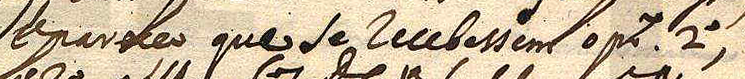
E pareceo que se Recebessem o pr.o 2o,
